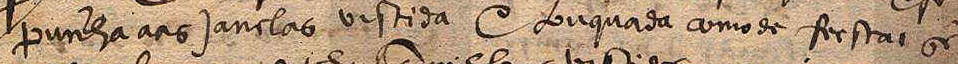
punha aas Janelas vistida e touquada como de feesta / sē
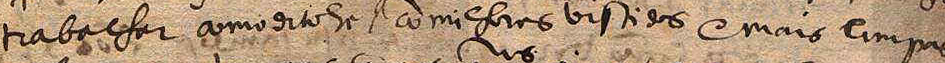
trabalhar como dito he / c̄o milhores vistidos e mais limpas
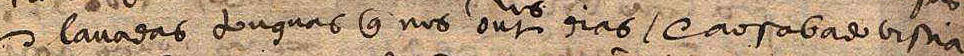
e lauadas touquas q̄ nos outros dias / e ao sabado vistia
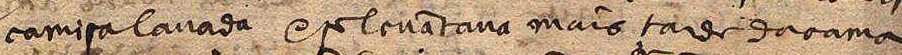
camisa lauada e se leuātaua mais tarde da cama
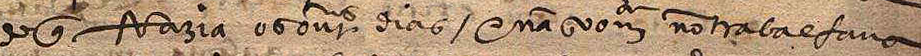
do q̄ ffazia os outros dias / e nā soomte n̄o trabalhaua
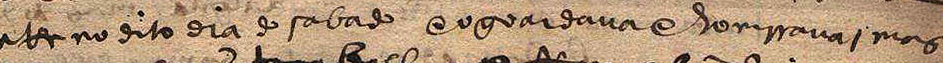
a Re no dito dia do sabado e o goardaua e homrraua / mas
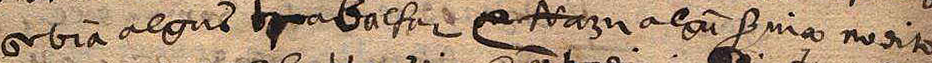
se via algūs trabalhar e ffazer algū ꞩuiço no dito
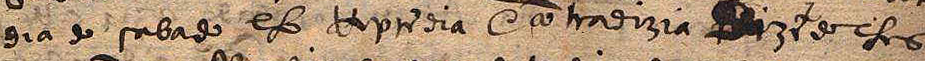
dia do sabado lho Reprēdia e c̄otradizia dizēdo lhes
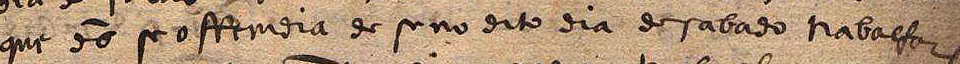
que d̄s se offemdia de se no dito dia do sabado trabalhar/
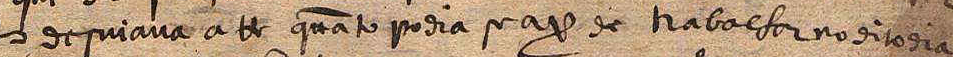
e desuiaua a Re q̄uato podia se aꝟ de trabalhar no dito dia
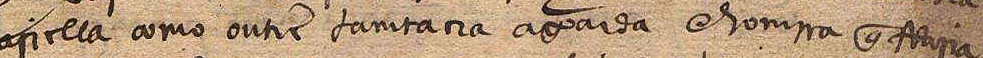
asi ella como outrē tamta era a goarda e homrra q̄ ffazia
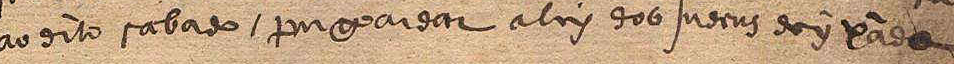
ao dito sabado / por goardar a ley dos Judeus deyxādo
